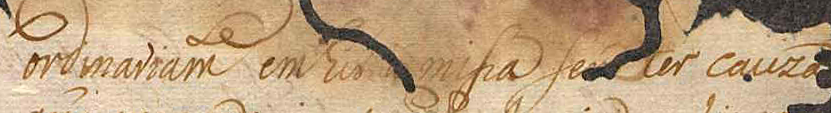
ordinariamte em hir a missa sem ter cauza
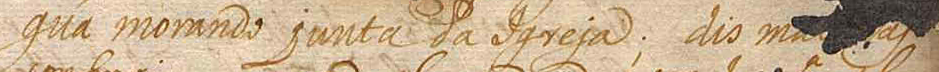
gūa morando junta da Igreja; dis ma as
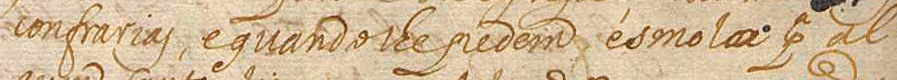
confrarias, e quando lhe pedem esmola pa al
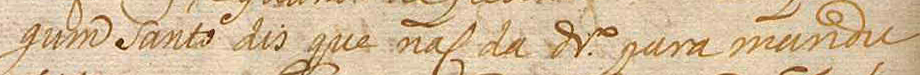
gum santo dis que naõ da dr.o para mundu
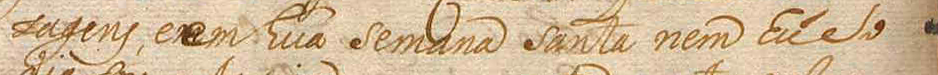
zagens, e em huā semana santa nem hū so
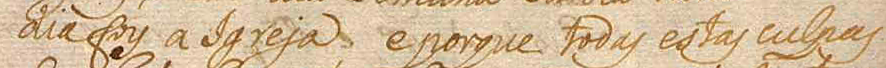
dia foy a Igreja, e porque todas estas culpas
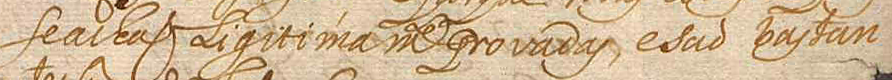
se achaõ Ligitimamte provadas, e saõ bastan
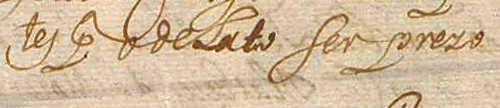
tes pa o deLato ser prezo
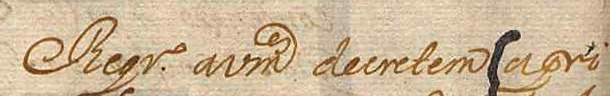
Reqr.o a v mces decretem a pri
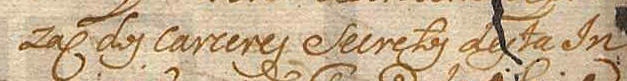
zaõ dos carceres Secretos desta In
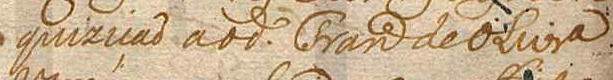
quiziçaõ ao d.o Franco de OLivra
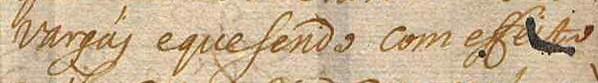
Vargas e que sendo com effeito
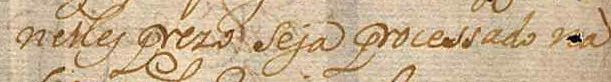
nelles prezo seja processado na
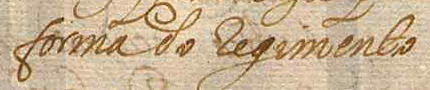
forma do Regimento
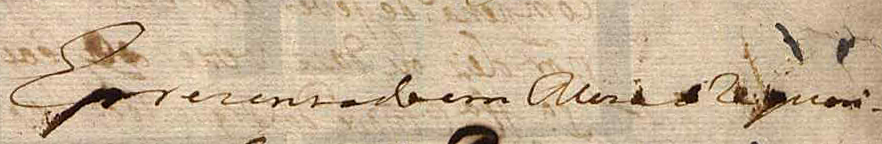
E prezentado em Meza o Requeri
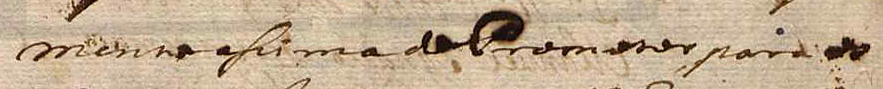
mento assima do Promotor, para os
